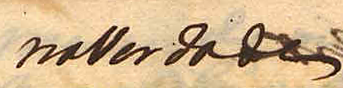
na Verdade
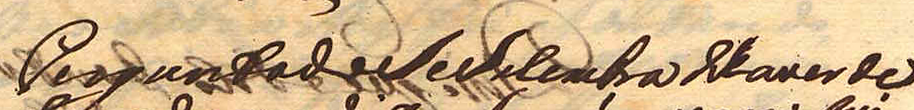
Perguntado Se Se lembra de haver de
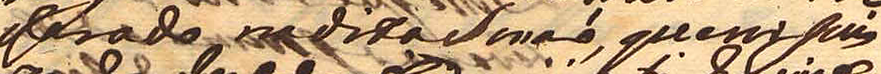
clarado na dita Sessaõ, que no jui
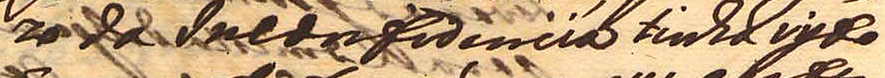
zo da Inconfidencia tinha visto
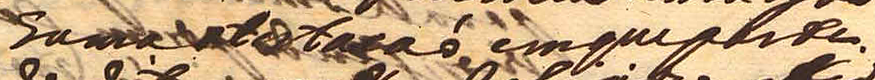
huma atestaçaõ em que parte
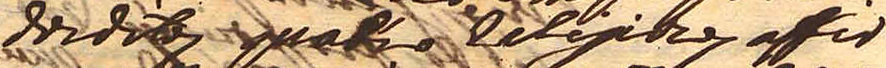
dos ditos quatro Religiozos affir
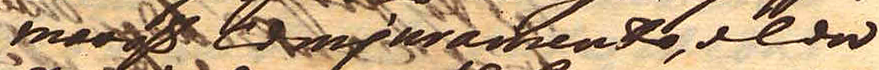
mavaõ com juramento, o con
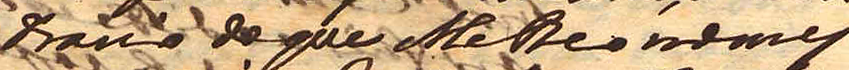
trario do que elle Reo no mes
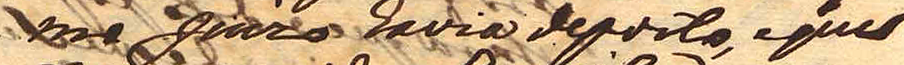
mo Juizo havia deposto, e que
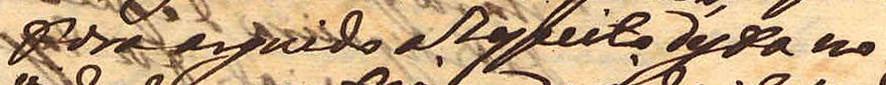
fora arguido a Respeito desta no
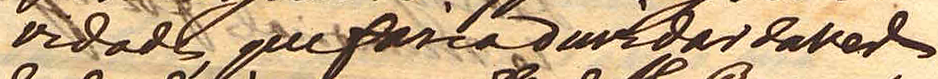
vidade, que fazia duvidar da ver
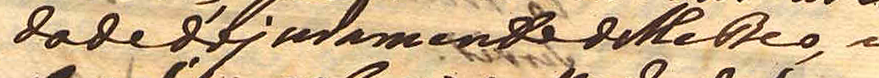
dade do juramento delle Reo, e
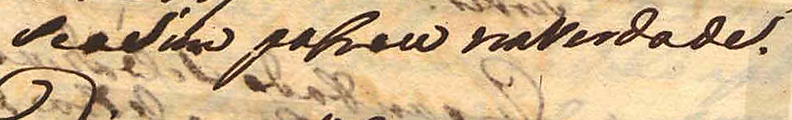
se asim passou na verdade.
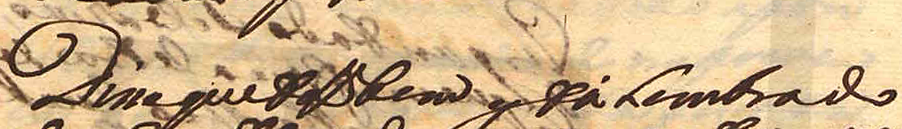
Disse que taõbem está lembrado
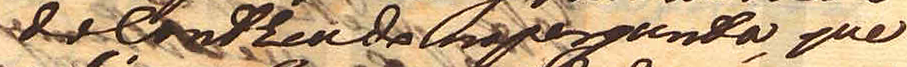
do Contheudo na pergunta que
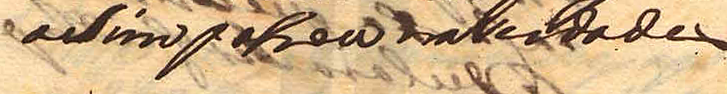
aSim passou na Verdade
